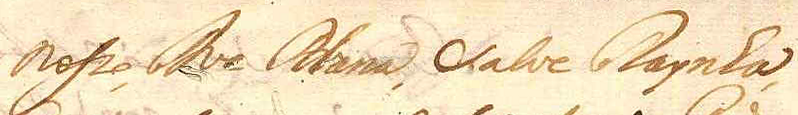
nosso, Ave Maria, Salve Raynha,
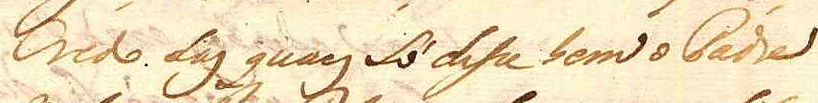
Credo. das quaes só disse bem o Padre
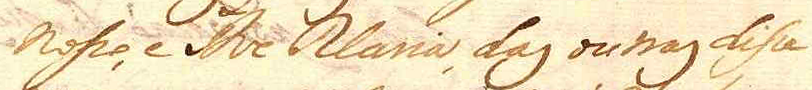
nosso, e Ave Maria, das outras disse
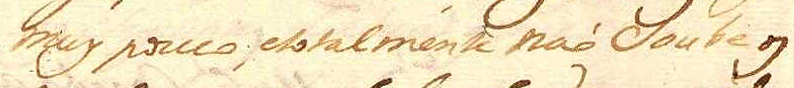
muy pouco, e totalmente naõ soube os
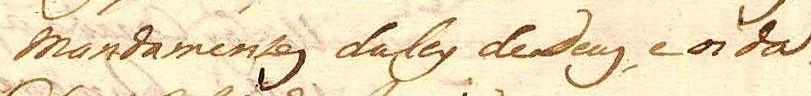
mandamentos da ley de Deus, e os da
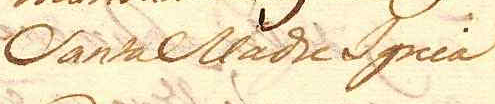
Santa Madre Igreia
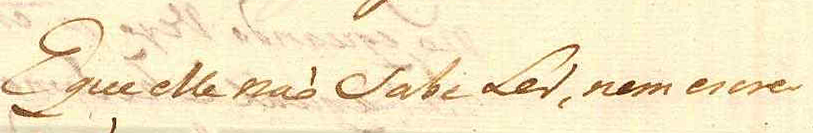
E que elle naõ sabe Ler, nem escre
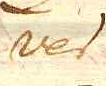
ver
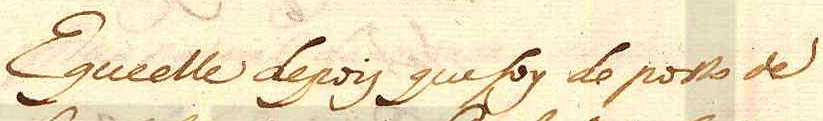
E que elle depois que foy do porto de
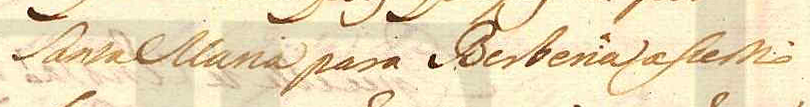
Santa Maria para Berberia assestio
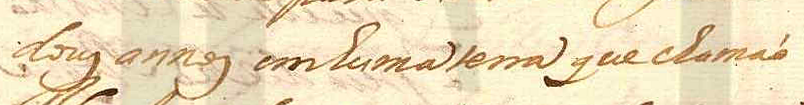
dous annos em huma terra que chamaõ
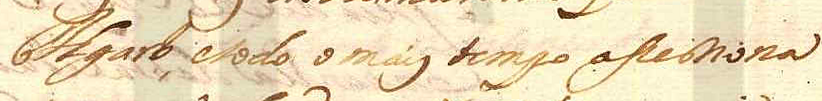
Algarb, e todo o mais tempo asestio na
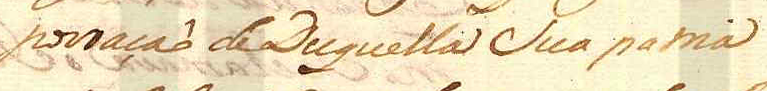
povoaçaõ de Duquella Sua patria
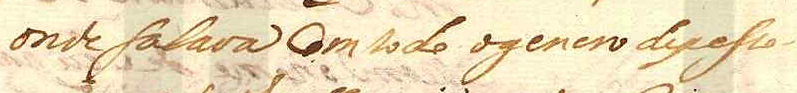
onde falava com todo o genero de pesso
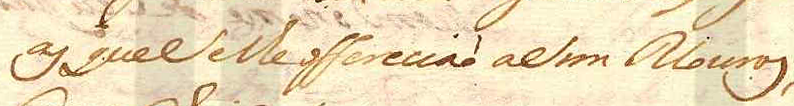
as que se lhe offereciaõ asim Mouros,
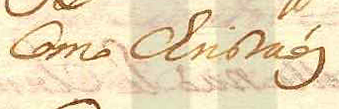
Como Christaõs
